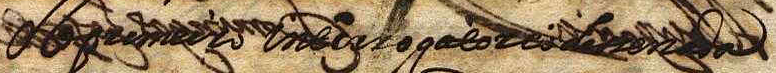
Ao primeiro interrogatorio disse nada
